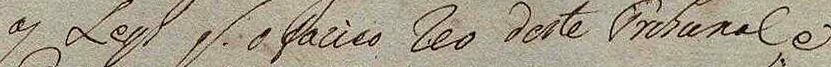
as Leys q̄ o faziao Reo deste Tribunal, e
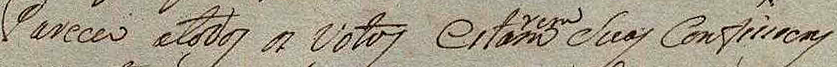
Pareceo a todos os Votos estamrem suas Confissoens
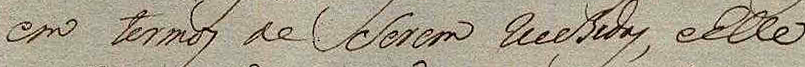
em termos de serem Recebidas, e elle
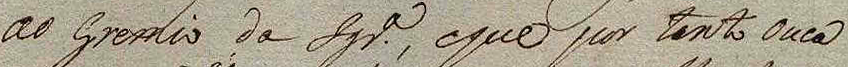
ao Gremio da Igr.a, e que por tanto ouca
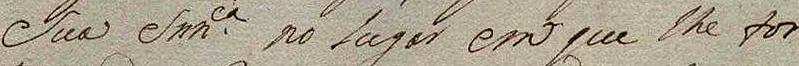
Sua Snnca. no lugar em que lhe for
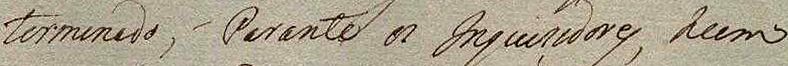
termenado, Perante os Inquisidores, hum
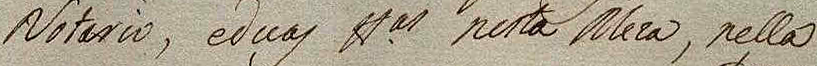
Notario, e duas tt.as nesta Meza, nella
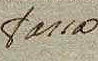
fassa
